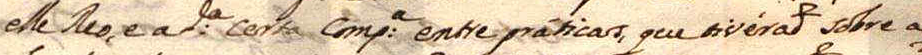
elle Reo, e a d̄:a certa comp:a entre práticas, que tiveraõ sobre a
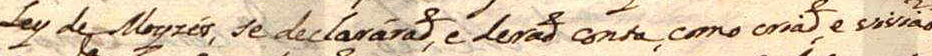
Ley de Moyzés, se declaráraõ, e deraõ conta, como criaõ, e viviaõ
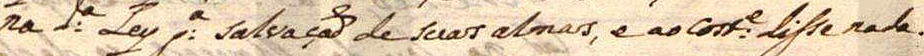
na d̄:a Ley p:a salvaçaõ de suas almas, e ao cost:e disse nada
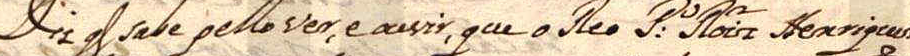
Diz q̄ sabe pello ver, e ouvir, que o Reo P:o Roīz Henriquez
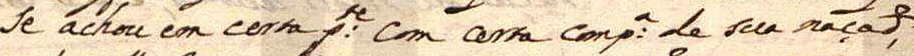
se achou em certa p:te com certa comp:a de sua naçaõ,
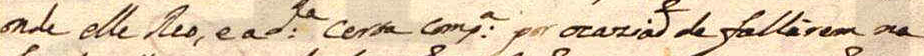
onde elle Reo, e a d̄:a certa comp:a por ocaziaõ de fallarem na
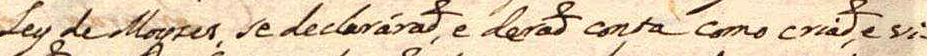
Ley de Moyzes, se declaráraõ, e deraõ conta como criaõ, e vi
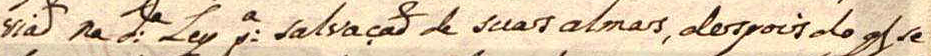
viaõ na d̄:a Ley p:a salvaçaõ de suas almas, despois do q̄ se
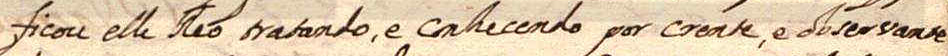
ficou elle Reo tratando, e conhecendo por crente, e observante
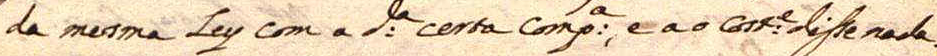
da mesma Ley com a d̄:a certa comp:a, e ao cost:e disse nada.
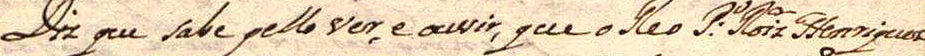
Diz que sabe pello ver, e ouvir, que o Reo P:o Roīz Henriquez
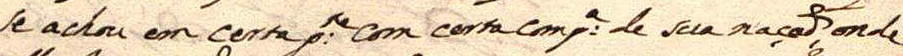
se achou em certa p:te com certa comp:a de sua naçaõ, onde
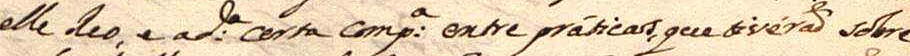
elle Reo, e a d̄:a certa comp:a entre práticas, que tiveraõ sobre
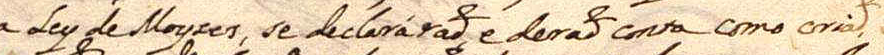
a Ley de Moyzes, se declaráraõ e deraõ conta como criaõ, e
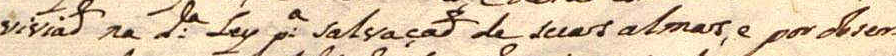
viviaõ na d̄:a Ley p:a salvaçaõ de suas almas, e por obser
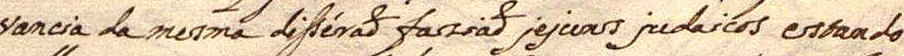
vancia da mesma disséraõ faziaõ jejuns judaicos estando
